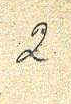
2
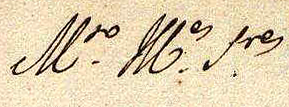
M.to Ill.es S.res
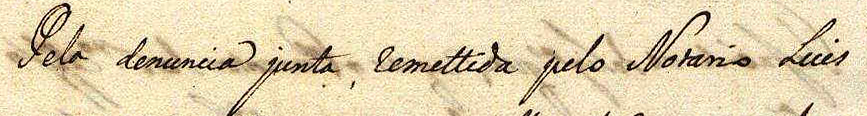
Pela denuncia junta, Remettida pelo Notario Luis
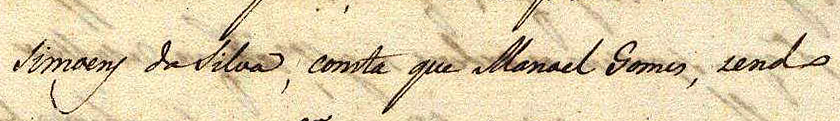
simoens da Silva, consta que Manoel Gomes, sendo
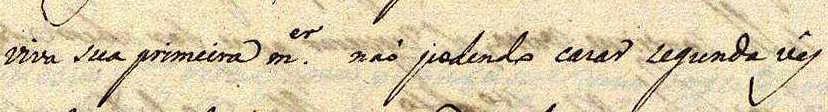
viva sua primeira m.er naõ podendo cazar segunda uês
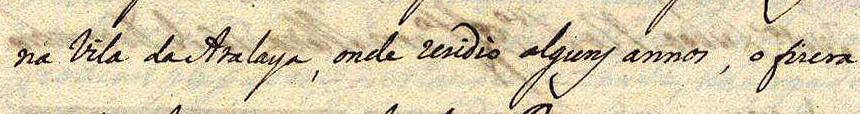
na Vila da Atalaya, onde residio alguns annos, o fizera
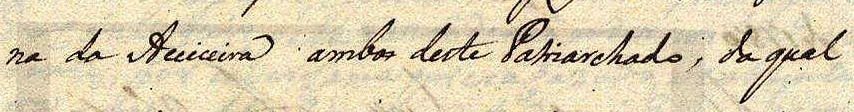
na da Aceiceira ambos deste Patriarchado, da qual
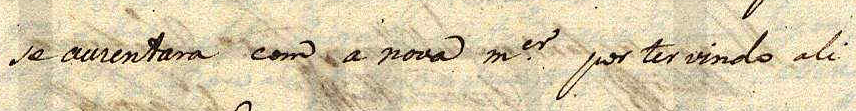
se auzentara com a nova m.er por ter vindo ali
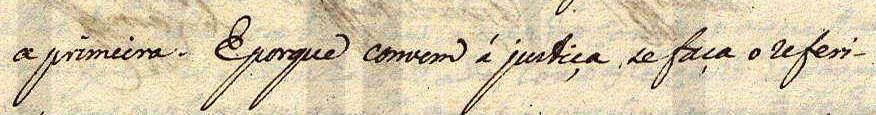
a primeira. E porque convem á justiça se faça o referi
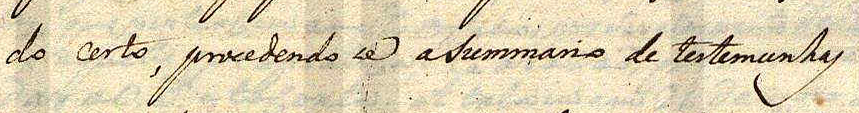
do certo, procedendo se a summario de testemunhas
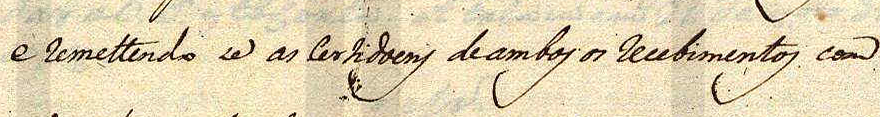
e Remettendo se as certidoens de ambos os Recebimentos com
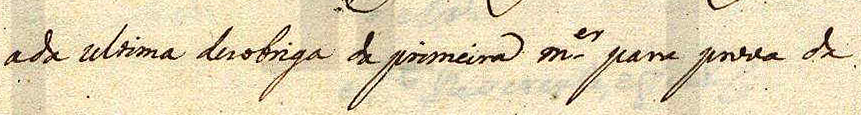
a da ultima desobriga da primeira m.er para prova de
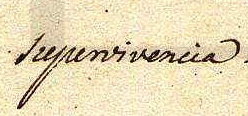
supervivencia.
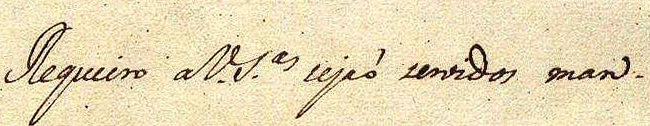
Requeiro a V. S.as sejaõ servidos man
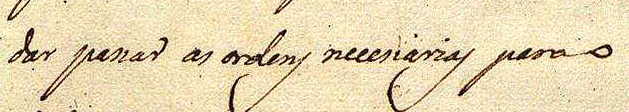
dar passar as ordens necessarias para o
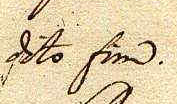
dito fim.
